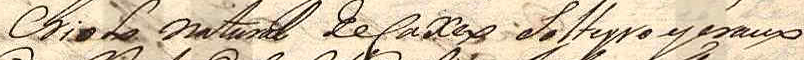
Criolo natural de Caxeo Solteyro escrauo
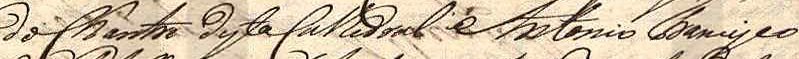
do Chantre desta Cathedral Antonio Francisco
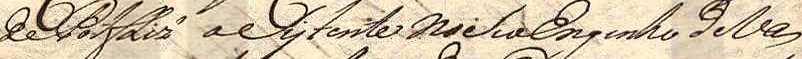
de PolfLiz̄ aSistente no seo Engenho de Va
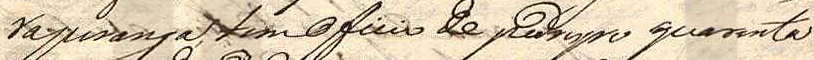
raperanga tem officio de pedreyro quarenta
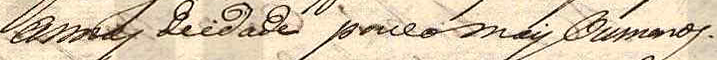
annos de idade pouco mais Ou menos.
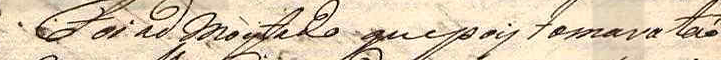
Foi admoestado que pois tomava taõ
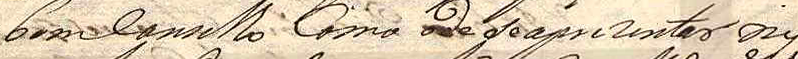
bem conselho Como o de se aprezentar nes
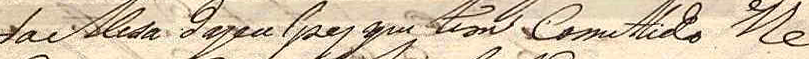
ta Mesa das culpas que tem Comettido lhe
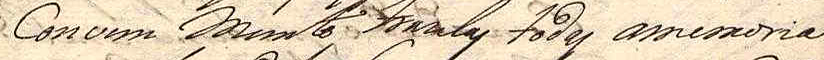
Convem Munto trazelas todas a memoria
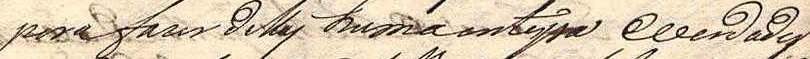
pera fazer dellas huma inteyra e verdadey
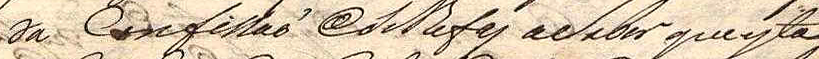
ra Confissaõ e selhe fes a Saber que esta
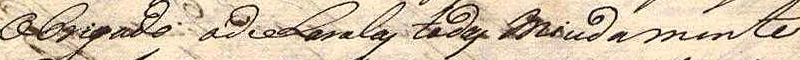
Obrigado a decLaralas todas miudamente
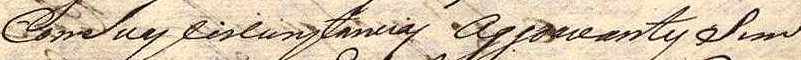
Com Suas circunstancias aggravantes Sem
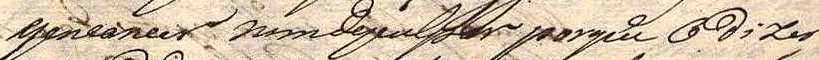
as encancer nem desculpar porque o dizer
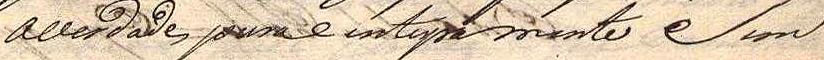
a uerdade pura e inteyramente Sem
